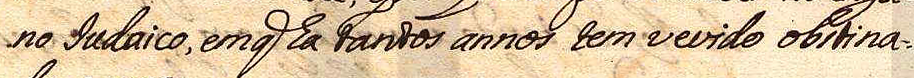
no Iudaico, em q̄ ha tantos annos tem vevido obstina
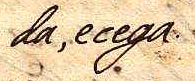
da, e cega.
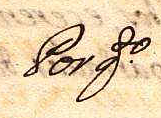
Porq.to
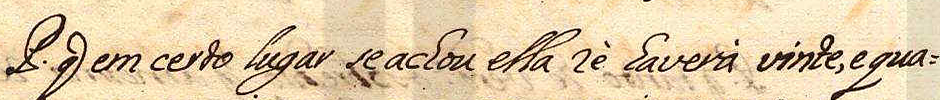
P. q̄ em certo lugar se achou ella rè haverá vinte, e qua
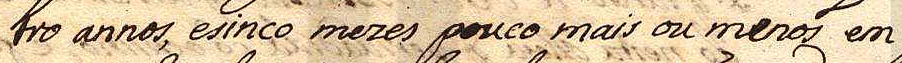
tro annos, e sinco mezes pouco mais ou menos en
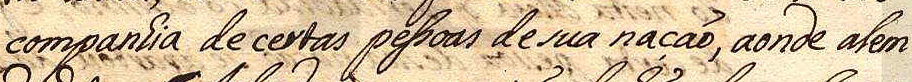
companhia de certas pessoas de sua naçaõ, aonde alem
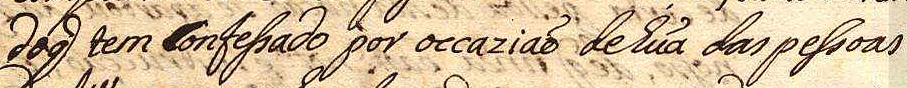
do q̅ tem Confessado por occaziaõ de huā das pessoas
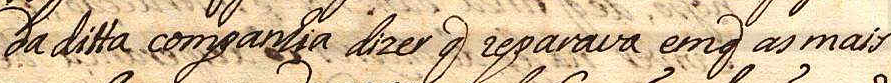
da ditta companhia dizer q̄ reparava em q̄ as mais
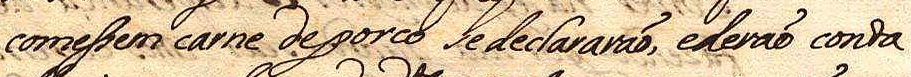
comessem carne de porco se declararaõ, e deraõ conta
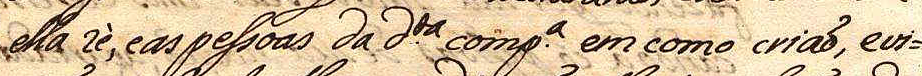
ella rè, e as pessoas da d.ta comp.a em como criaõ, e vi
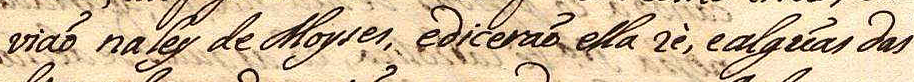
viaõ na ley de Moyses, e diceraõ ella rè, e algūas das
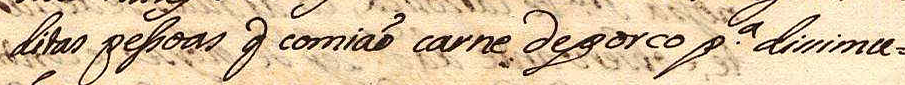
ditas pessoas q̄ comiaõ carne de porco p.a dissimu
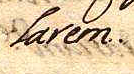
larem.
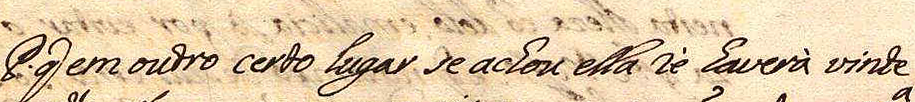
P. q̄ em outro certo lugar se achou ella rè haverà vinte
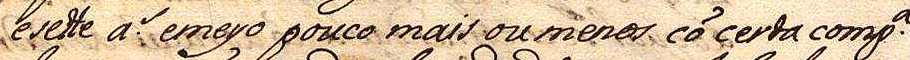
e sette ā. e meyo pouco mais ou menos cō certa comp.a
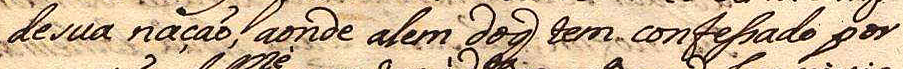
de sua naçaõ, aonde alem do q̄ tem confessado por
